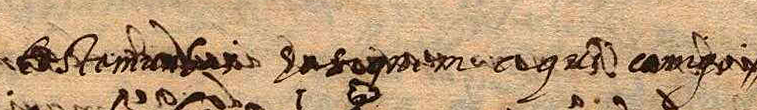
testemunhas E asignem aqui comigo //
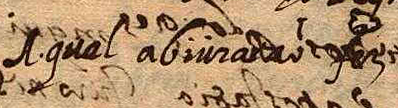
A qual abiuraçaõ fez
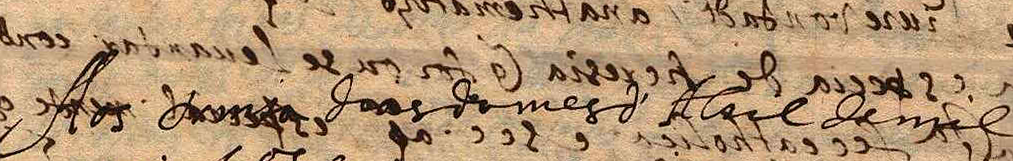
Aos trinta dias do mes d'Abril de mil
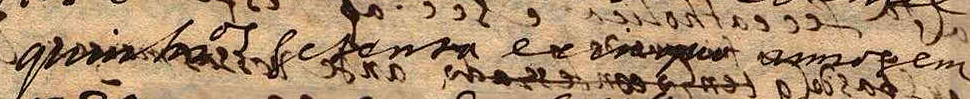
quinhtos setenta e cinquo annos em
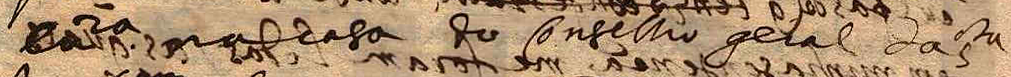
eura na casa do Conselho geral da scta
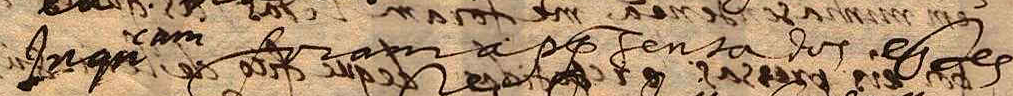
Jnquçam foram app̄sentados estes
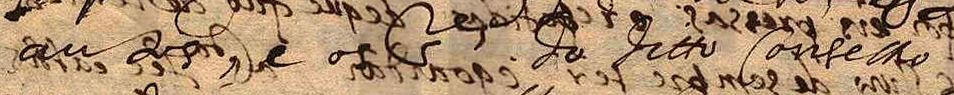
autos, e os Sres do ditto Conselho
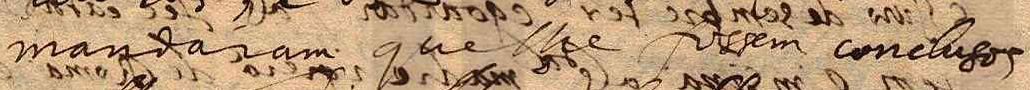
mandaram que lhe fossem conclusos
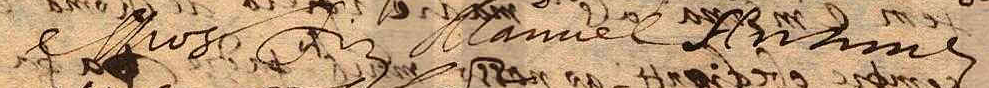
e lhos fiz Manuel Antunez
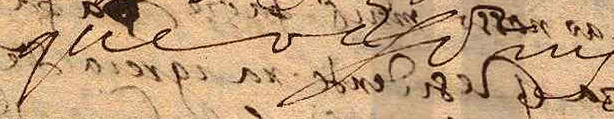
que o escruy
